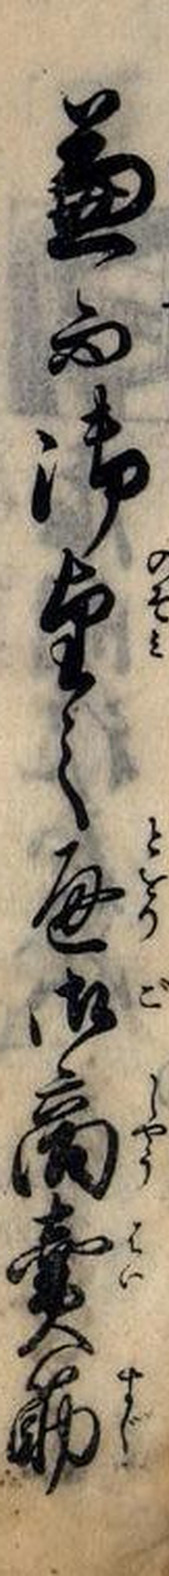兼而御望之通御商賣筋
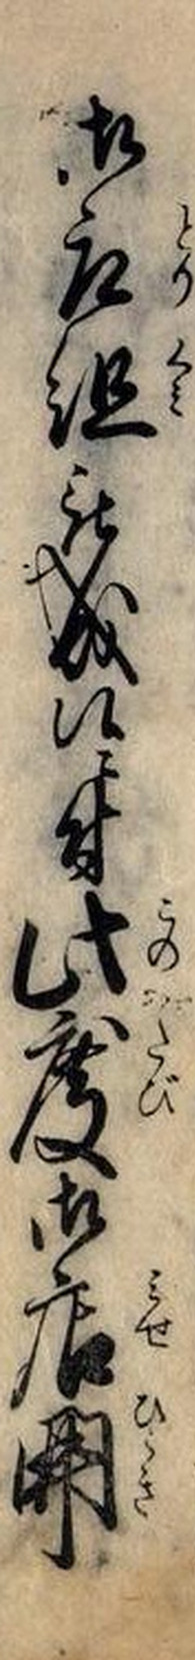御取組被成候に付此度御店開
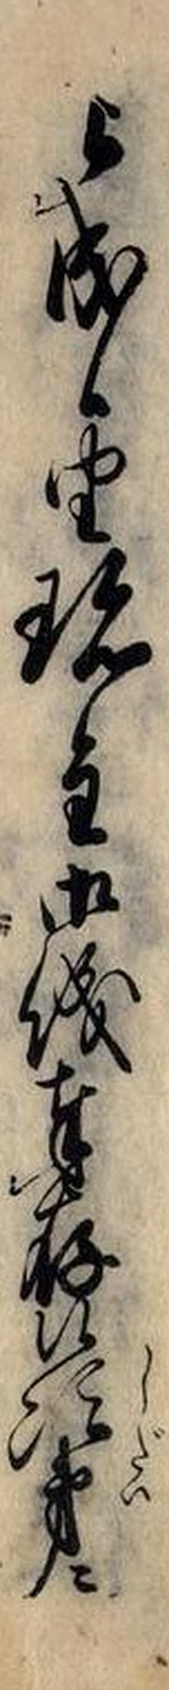被成候由珍主御儀奉存候次第に
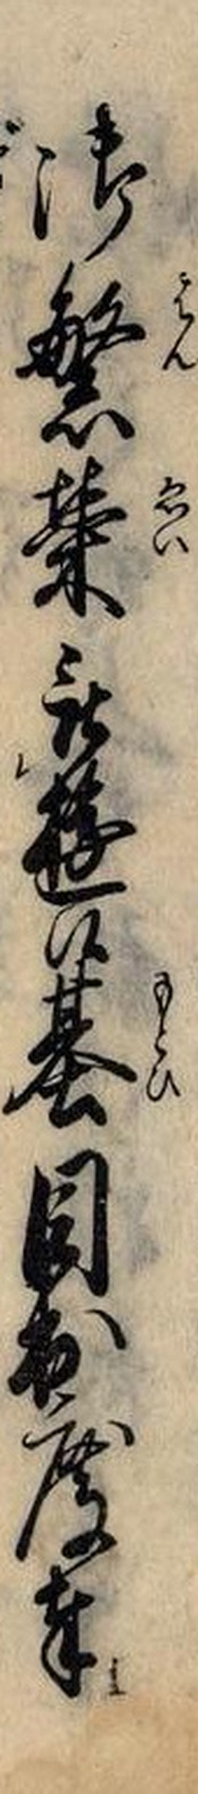御繁榮被遊候基目出度奉
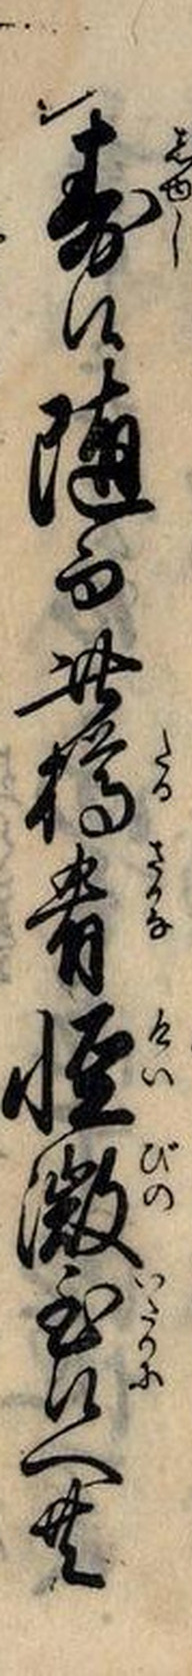寿候随而此樽肴軽微至候ヘ共
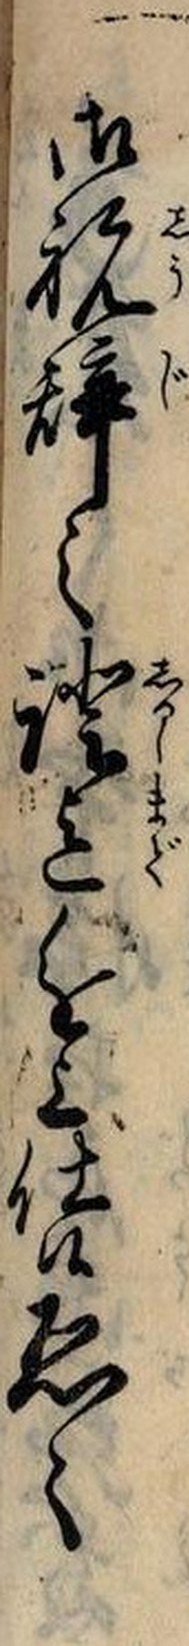御祝辞之證迄進上仕候恐々
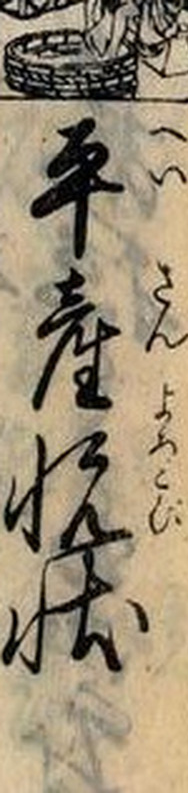平産悦状
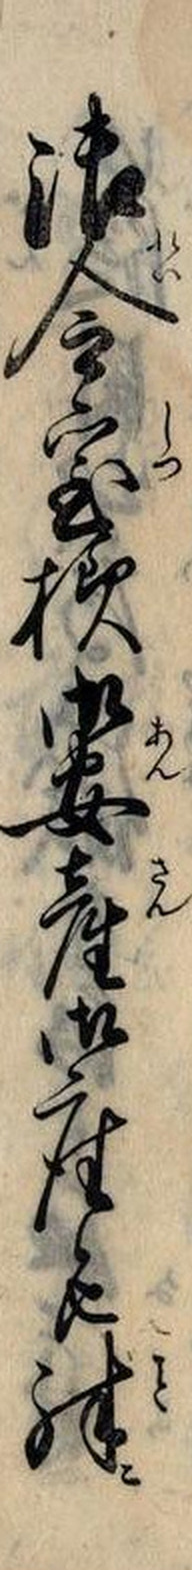御令室様御安産御座候由殊に
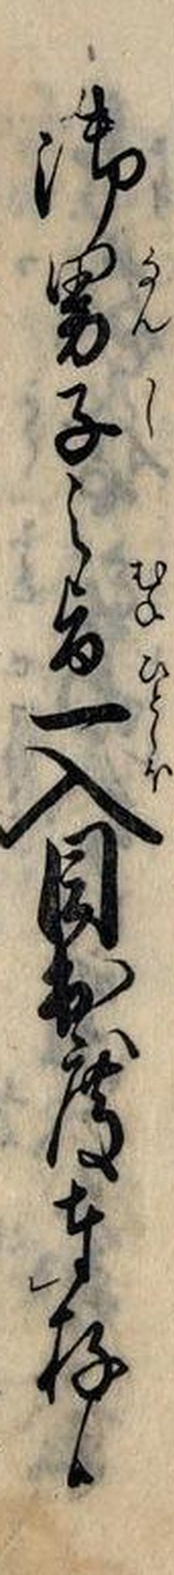御男子之旨一入目出度奉存候
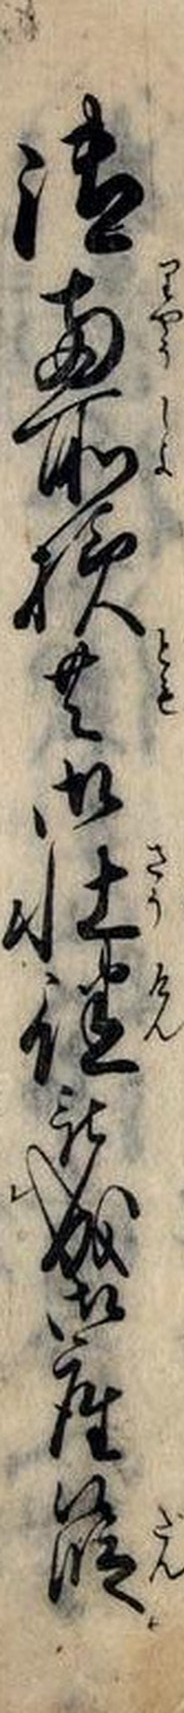御両所様共御壮健被成御座候段
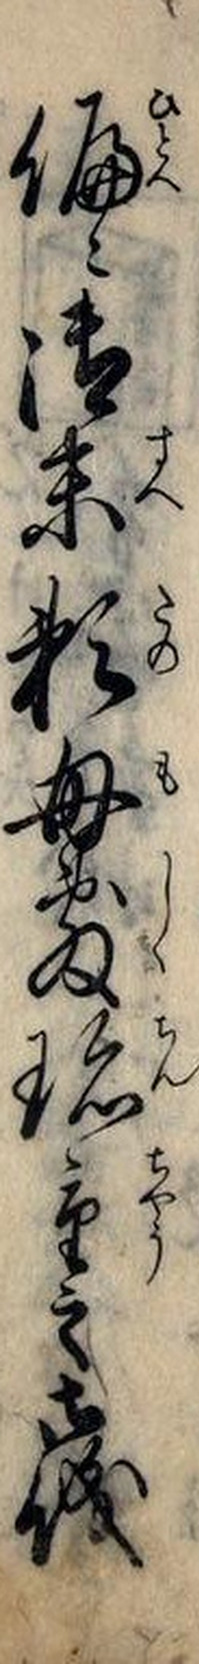偏に御末頼母敷珍重之御儀

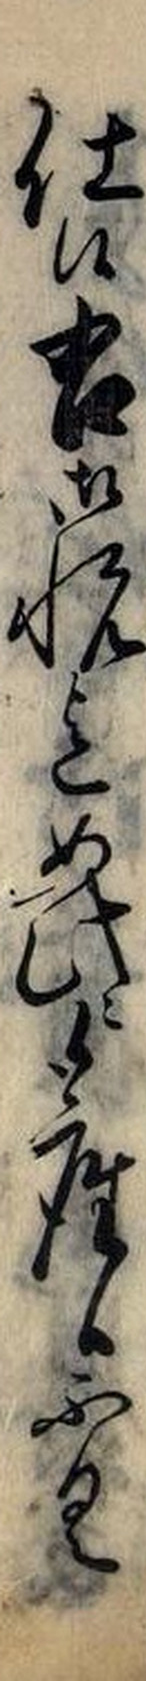仕候右御悦迄如此に御座候不具
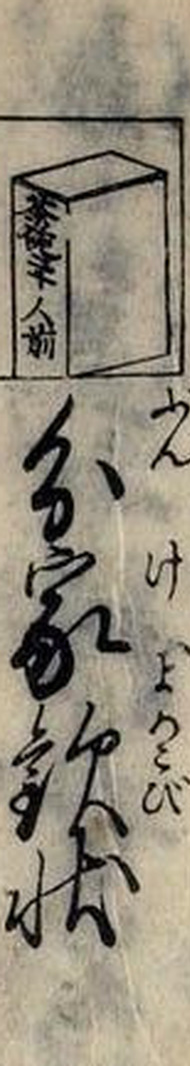分家歓状
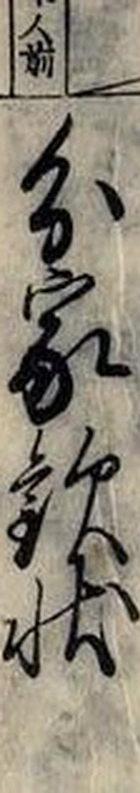分家歓状
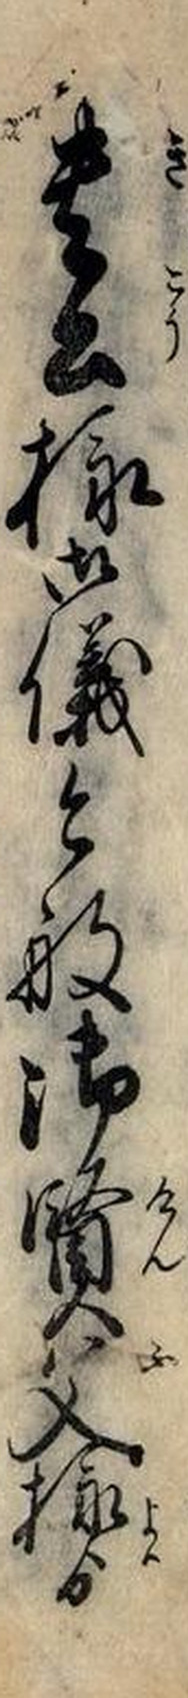貴公様御儀今般御賢父様ゟ
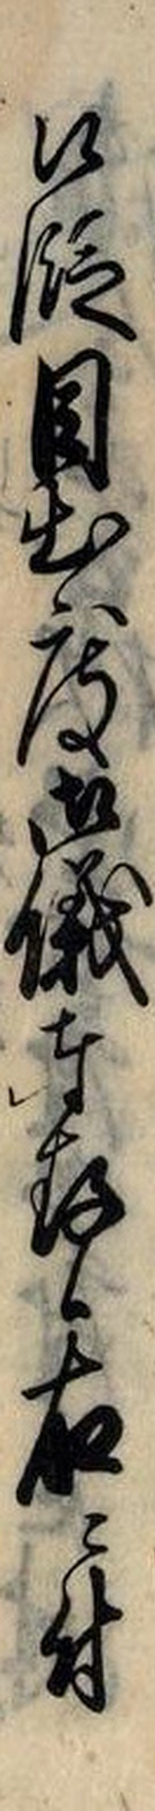候段目出度御儀奉存候右に付
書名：大成用文章（往来物）
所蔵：福井県文書館 Fukui Prefectural Archives
